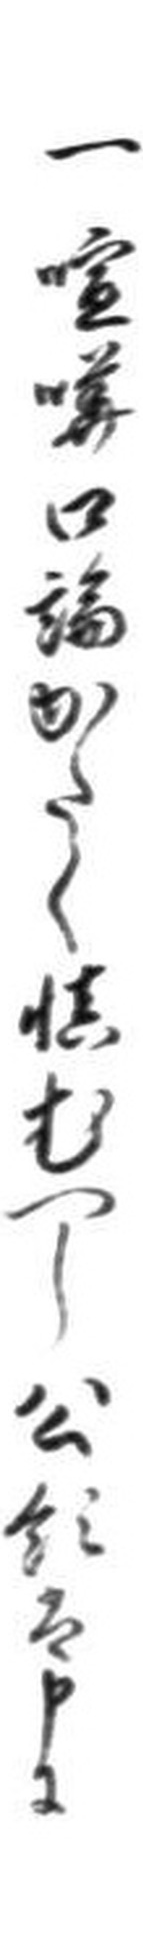一喧嘩口論かたく慎むへし公領は申に
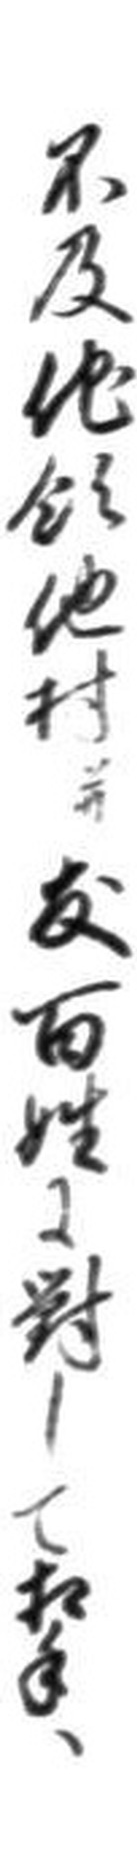不及他領他村并友百姓に対して相手へ

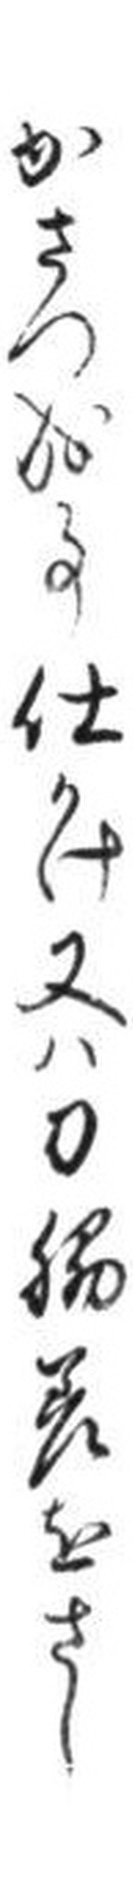かさつ成事仕かけ又は刀脇差をさし
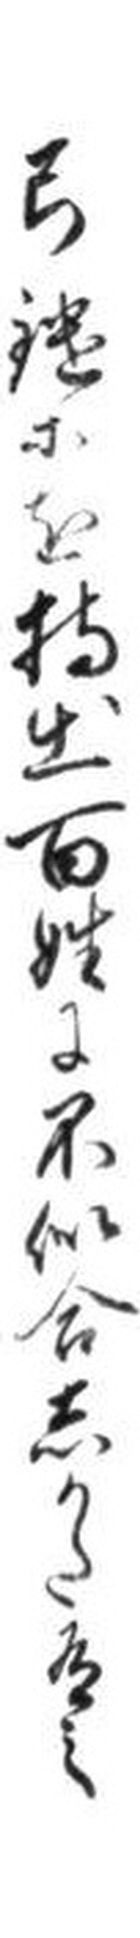弓鑓を持出百姓に不似合かた有之
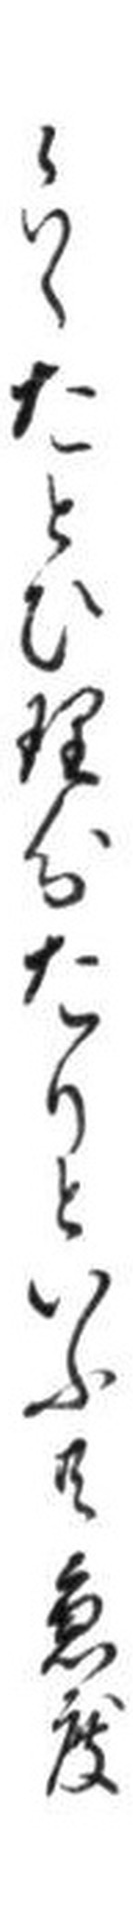候はゝたとひ理分たりといふ共急度
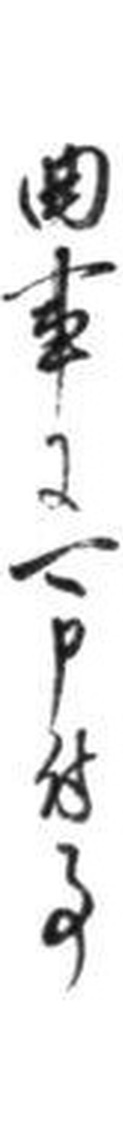曲事に可申付事
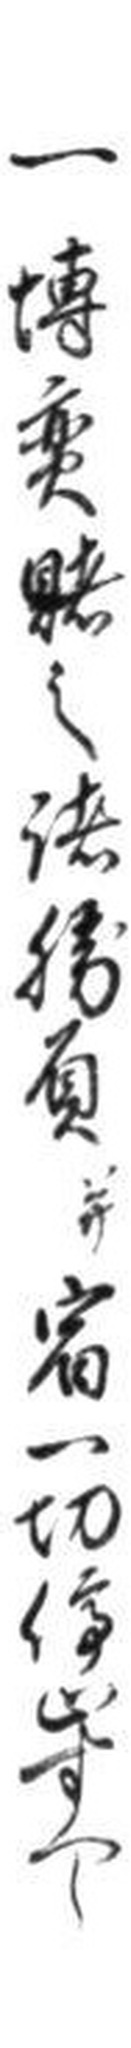一博奕賭之諸勝負并宿一切停止すへし
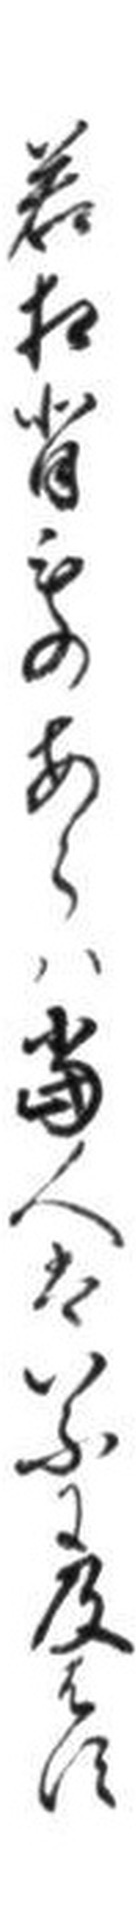若相背ものあらは当人はいふに及はす
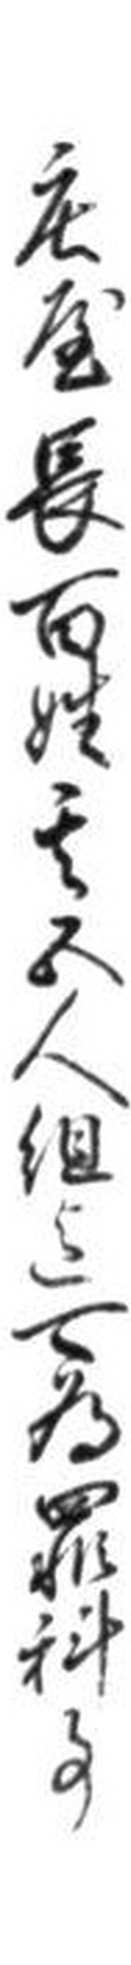庄屋長百姓其五人組迄可為罪科事
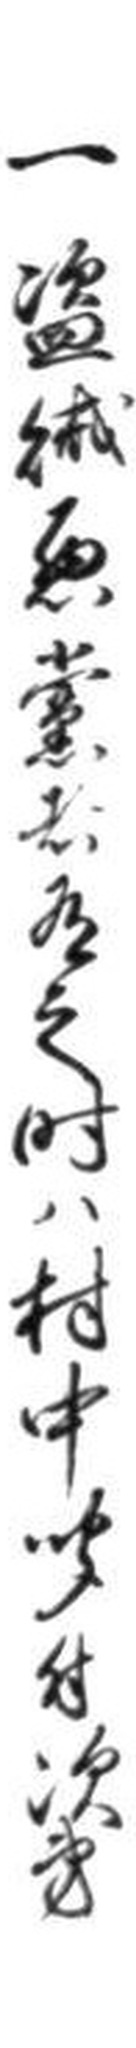一盗賊悪党者有之時は村中聞付次第
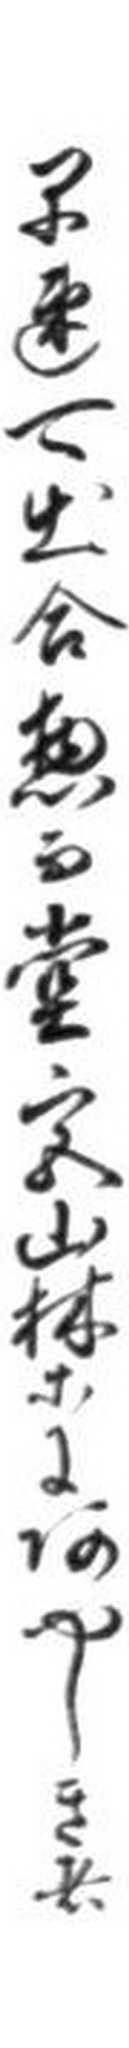早速可出合惣而堂宮等にあやしき者
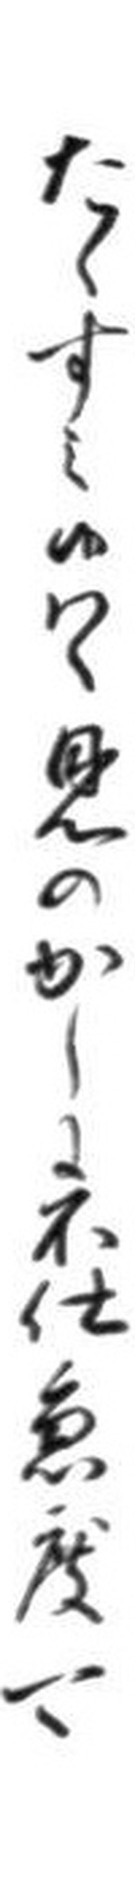たゝすみ候はゝ見のかしに不仕急度可
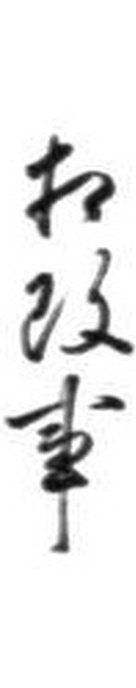相改事
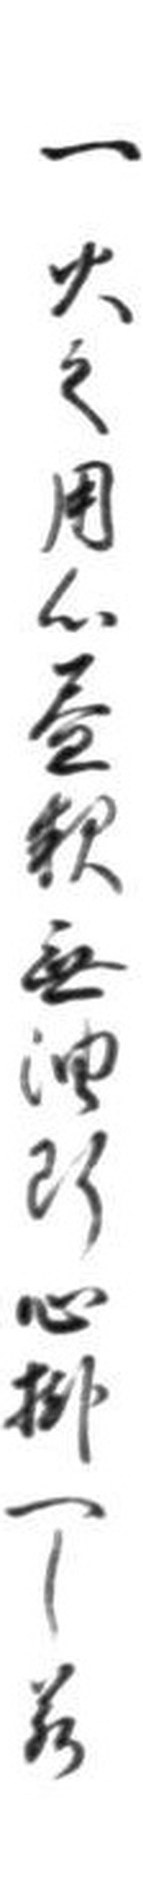一火之用心昼夜無油断心掛へし若
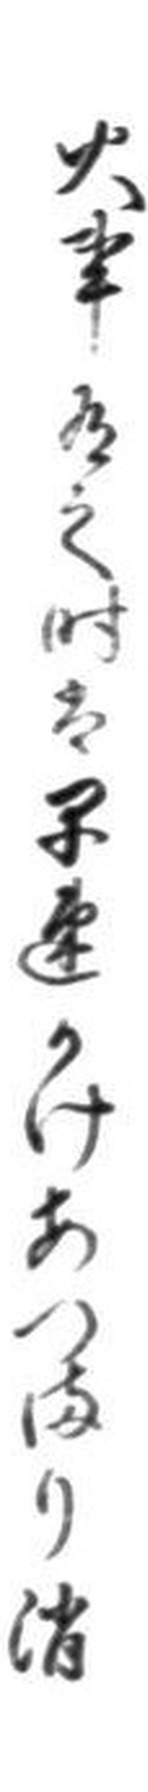火事有之時は早速かけあつまり消
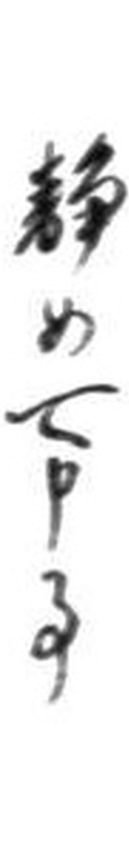鎮め可申事
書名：家譜 十六 吉品公 従貞享三年閏三月到同四年
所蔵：福井県文書館 Fukui Prefectural Archives
